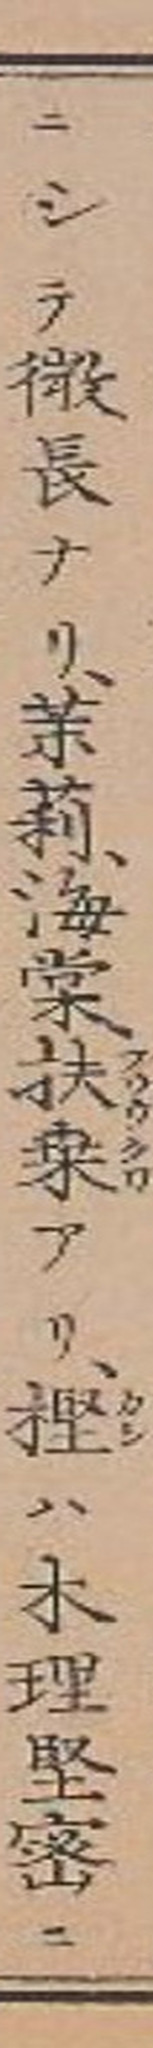ニシテ微長ナリ、茉莉、海棠、扶桑アリ、樫ハ木理堅密ニ
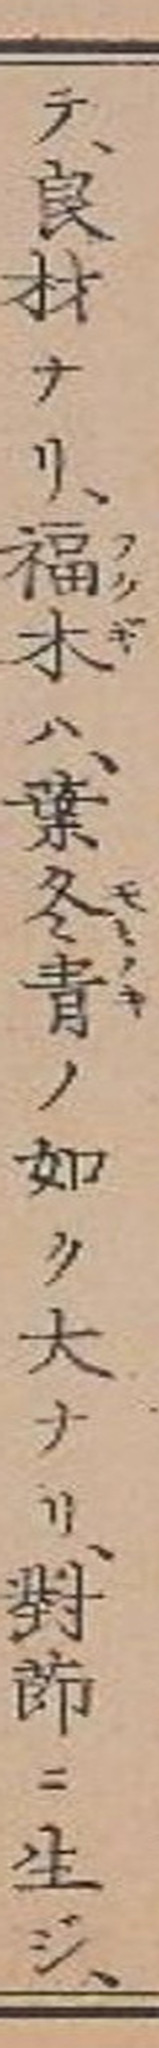テ、良材ナリ、福木ハ、葉冬青ノ如ク大ナリ、対節ニ生ジ、
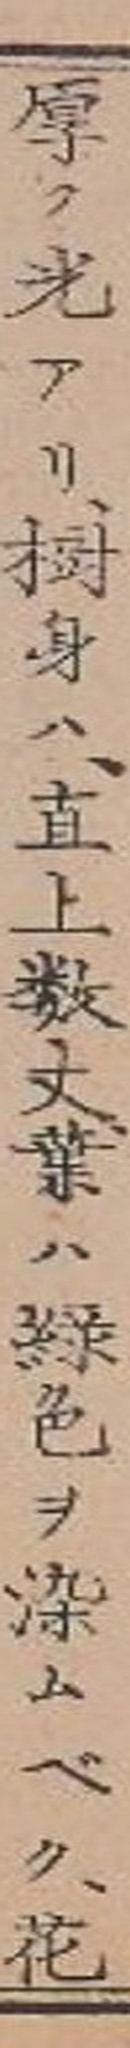厚ク光アリ、樹身ハ、直上数丈、葉ハ緑色ヲ染ムベク、花
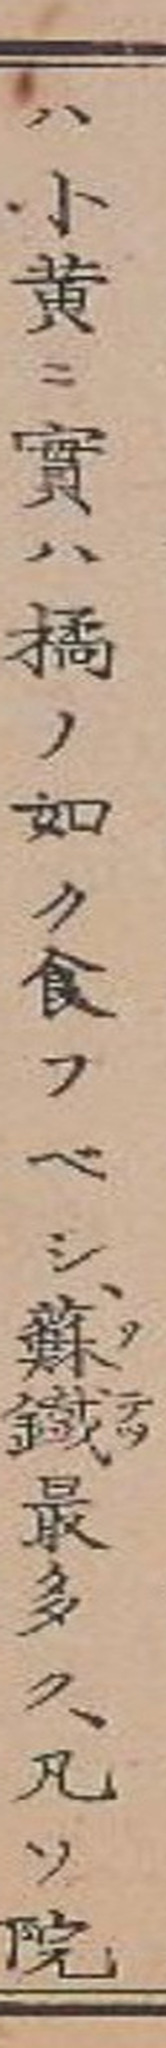ハ小黄ニ実ハ橘ノ如ク食フベシ、蘇鉄最多ク、凡ソ院
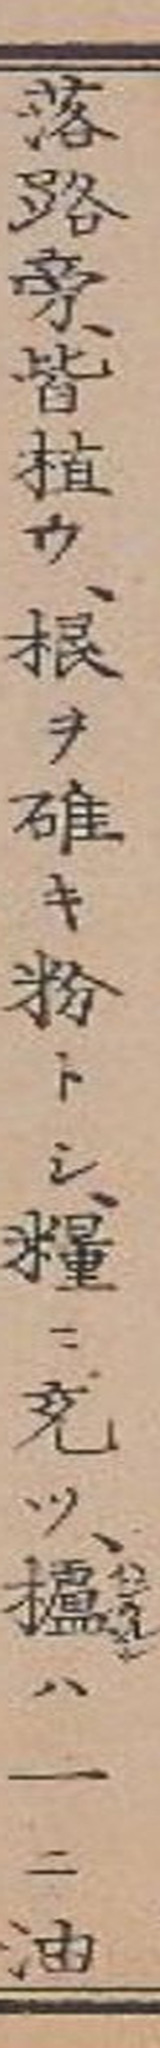落路旁、皆植ウ、根ヲ碓キ粉トシ、糧ニ充ツ、櫨ハ一ニ油
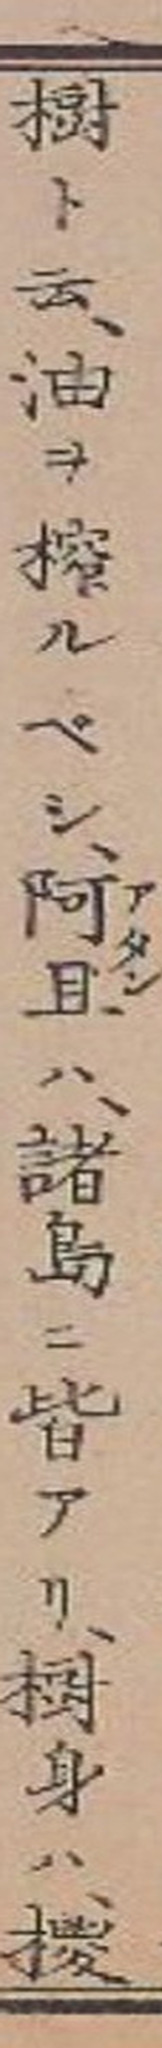樹ト云、油ヲ榨ルベシ、阿旦ハ、諸島ニ皆アリ、樹身ハ、棕
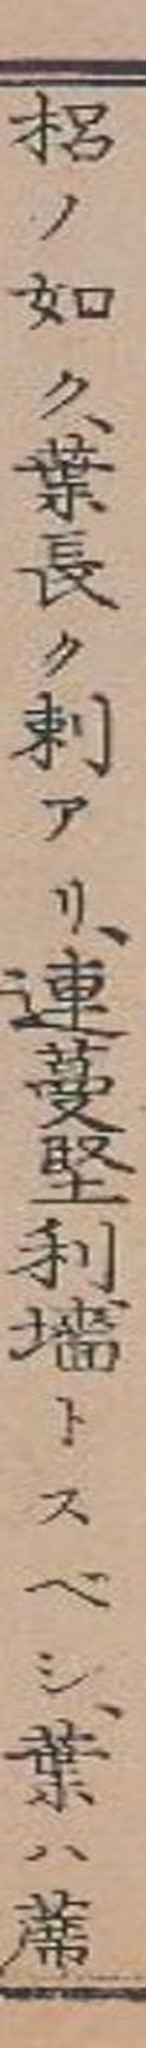梠ノ如ク、葉長ク剌アリ、連蔓堅利、牆トスベシ、葉ハ蓆
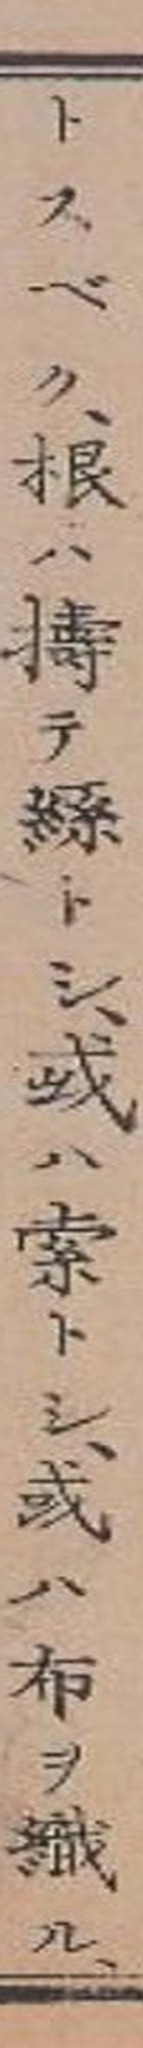トスベク、根ハ擣テ糸トシ、或ハ索トシ、或ハ布ヲ織ル、
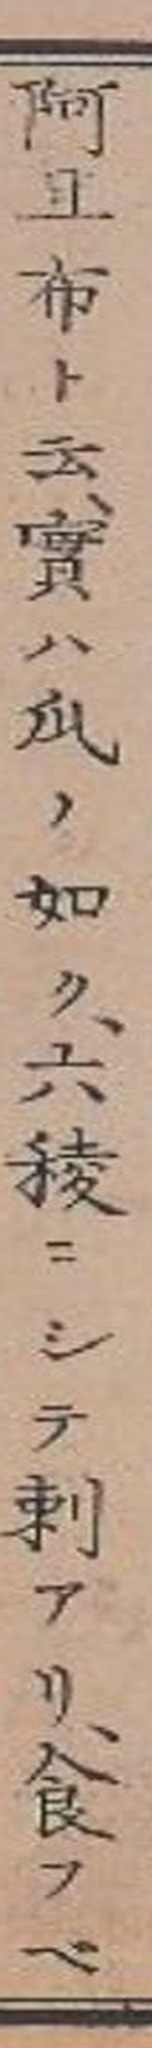阿旦布ト云、実ハ瓜ノ如ク、六稜ニシテ剌アリ、食フベ
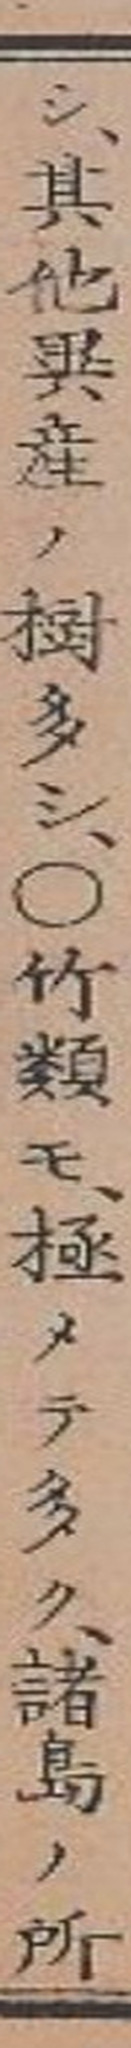シ、其他異産ノ樹多シ、○竹類モ、極メテ多ク、諸島ノ所

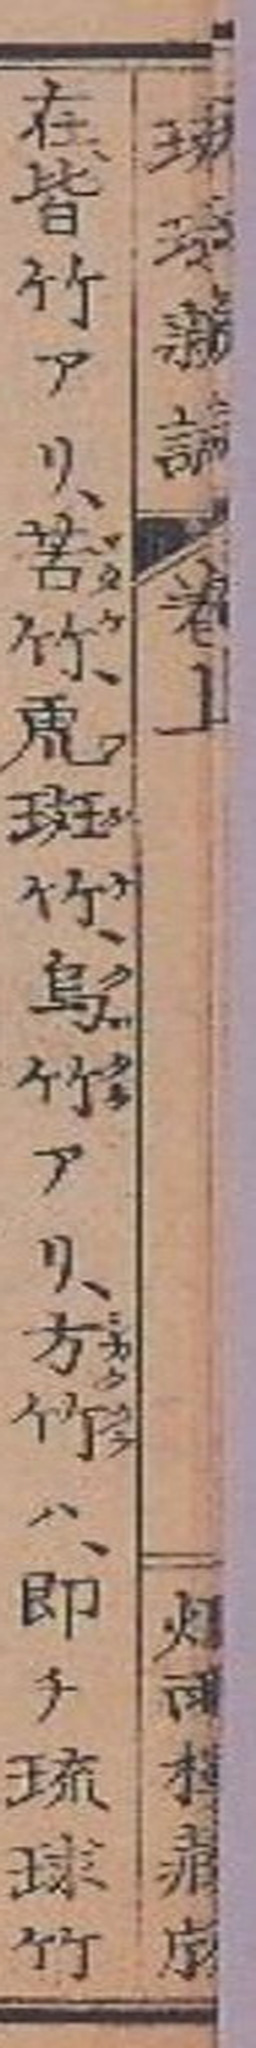在、皆竹アリ、苦竹、虎斑竹、烏竹アリ、方竹ハ、即チ琉球竹
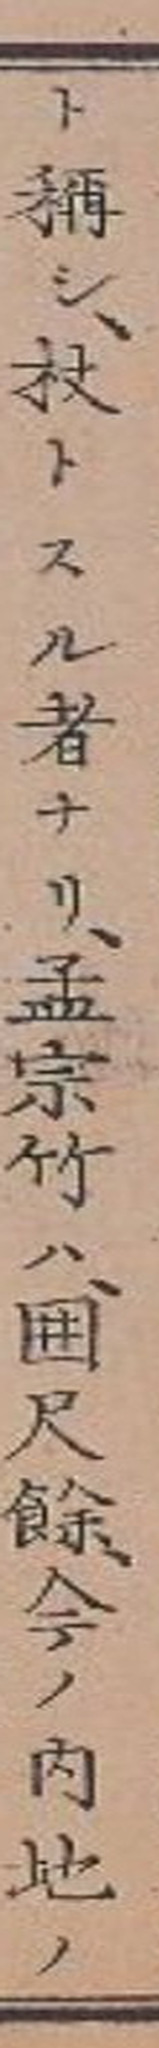ト称シ、杖トスル者ナリ、孟宗竹ハ、囲尺余、今ノ内地ノ
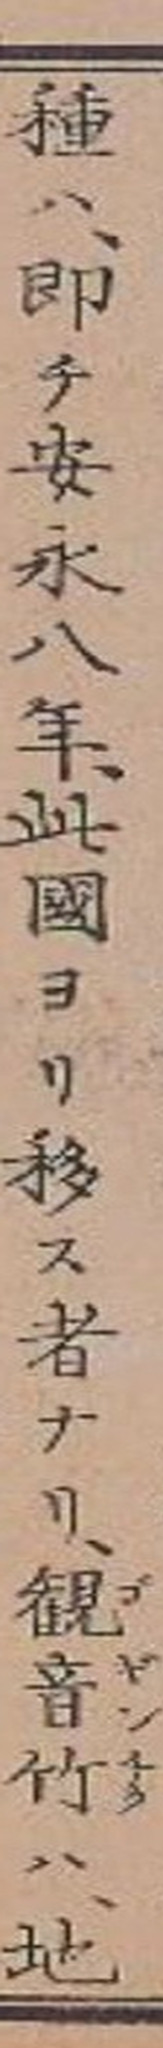種ハ、即チ安永八年、此国ヨリ移ス者ナリ、観音竹ハ、地
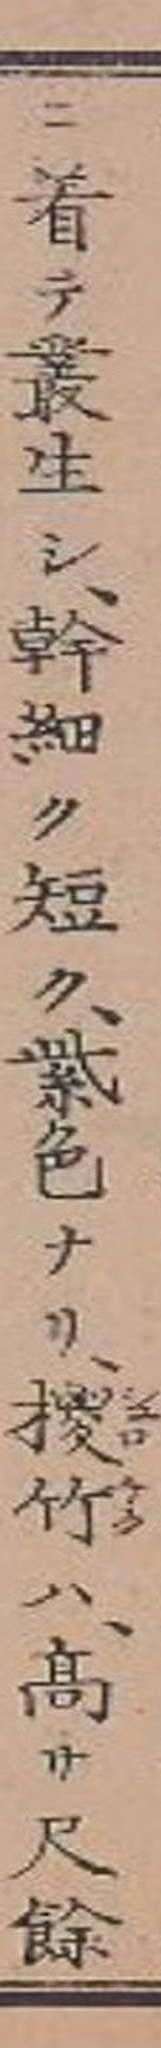ニ着テ叢生シ、幹細ク短ク、紫色ナリ、棕竹ハ、高サ尺余
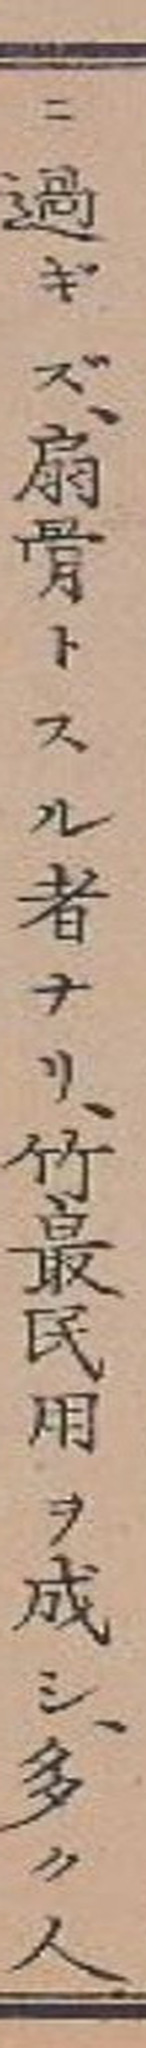ニ過ギズ、扇骨トスル者ナリ、竹最民用ヲ成シ、多ク人
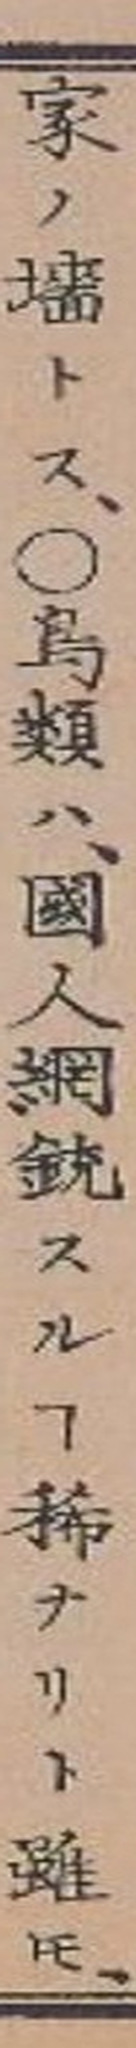家ノ牆トス、○鳥類ハ、国人網銃スルヿ稀ナリト雖トモ、
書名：琉球新誌 巻上
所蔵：University of the Ryukyus Library
